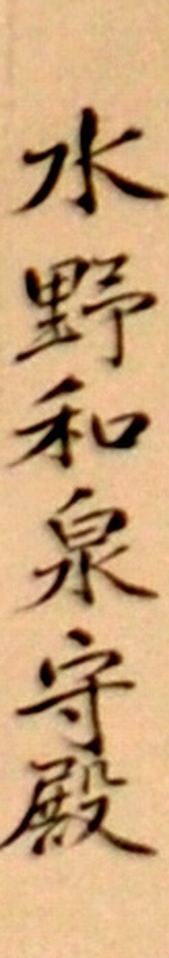水野和泉守殿
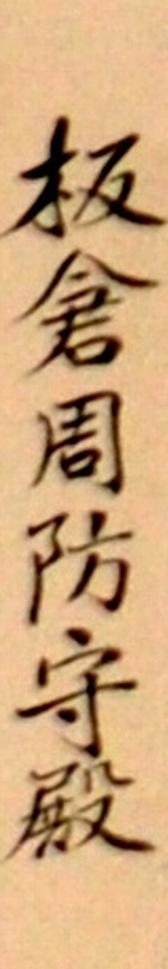板倉周防守殿
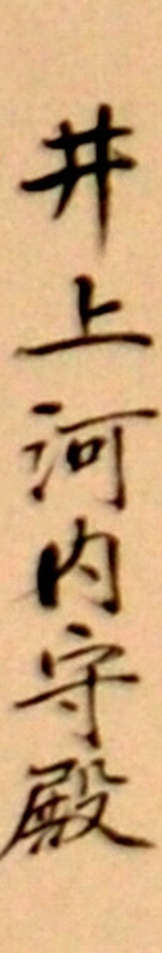井上河内守殿
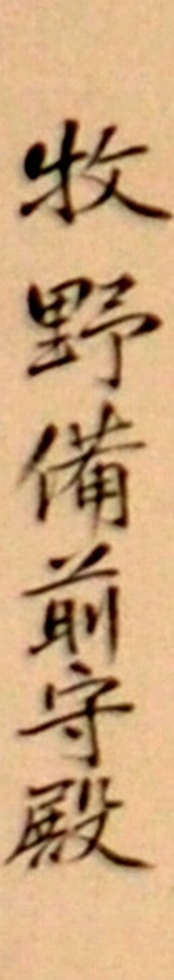牧野備前守殿
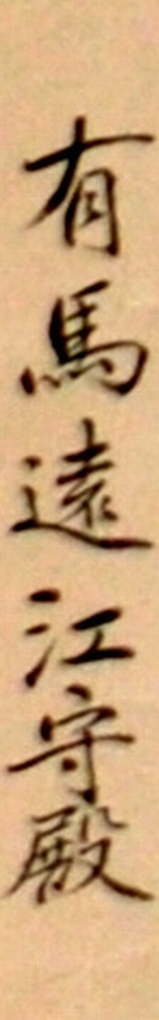有馬遠江守殿
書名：仮養子願
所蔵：伊那市立高遠町図書館・合同会社AMANE
